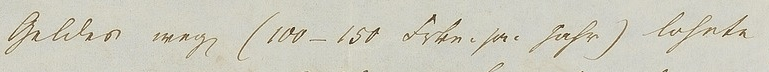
Geldes wegen (100-150 Frkn. pr. Jahr) lohnte
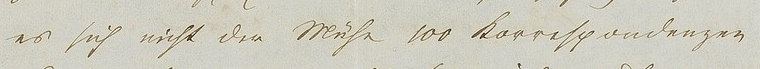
es sich nicht die Mühe 100 Korrespondenzen
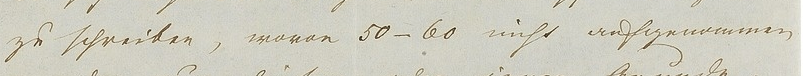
zu schreiben, wovon 50–60 nicht aufgenommen
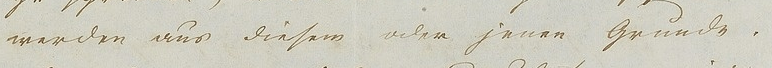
werden aus diesem oder jenen Grunde.
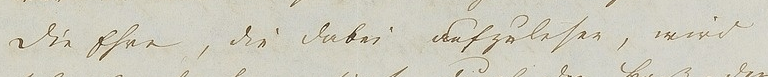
Die Ehre, die dabei aufzulesen, wird
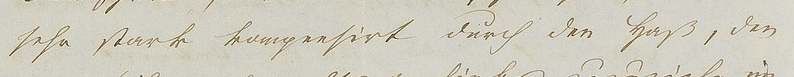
sehr stark kompensirt durch den Haß, den
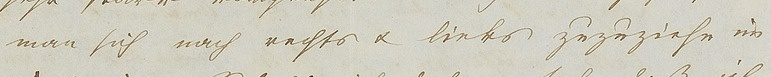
man sich nach rechts & links zuzuziehn im
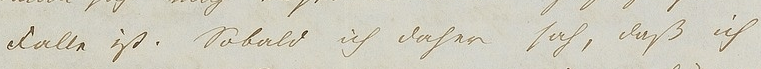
Falle ist. Sobald ich daher sah, daß ich
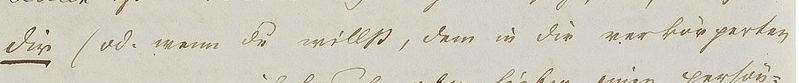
dir (od. wenn du willst, dem in dir verkörperten
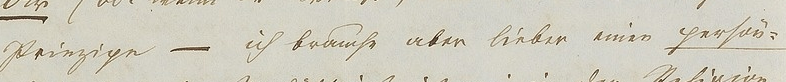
Prinzipe – ich brauche aber lieber einen persön-
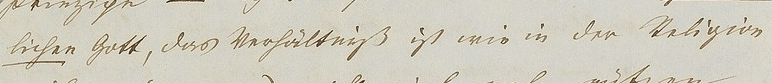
lichen Gott, das Verhältniß ist wie in der Religion
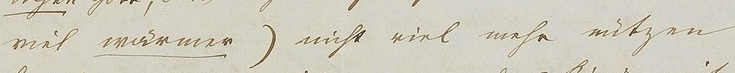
viel wärmer) nicht viel mehr nützen
